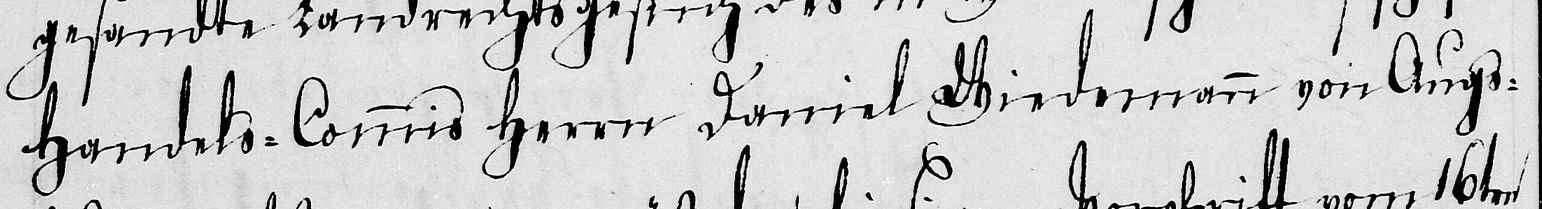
Handels-Commis Herrn Daniel Wiedemann von Augs¬
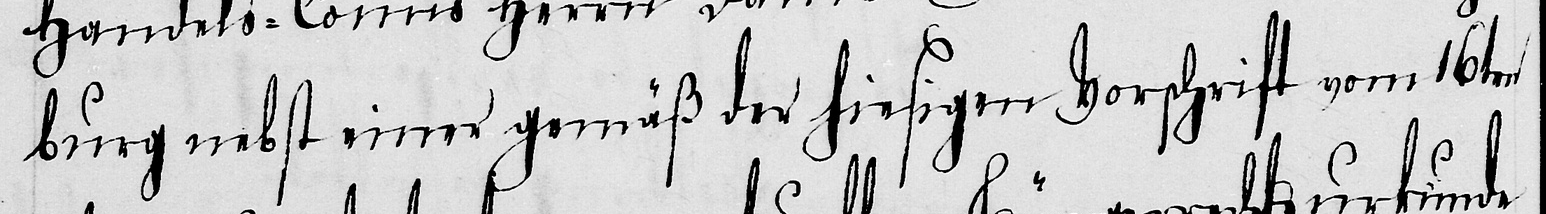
burg nebst einer gemäß der hiesigen Vorschrift vom 16ten
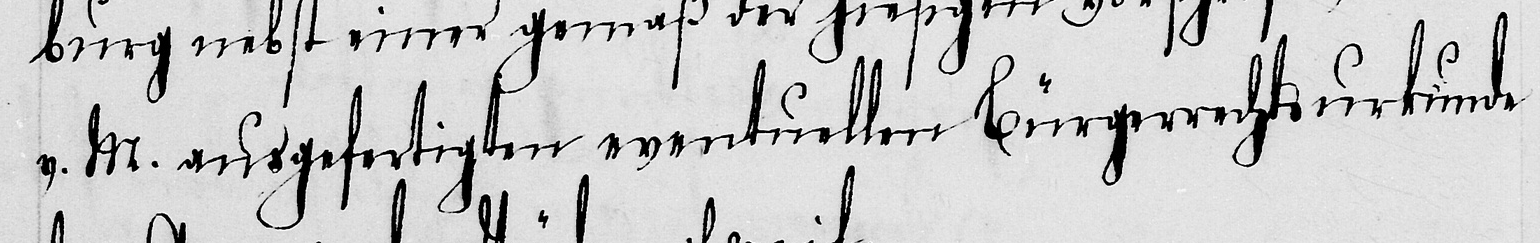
v. M. ausgefertigten eventuellen Bürgerrechtsurkunde
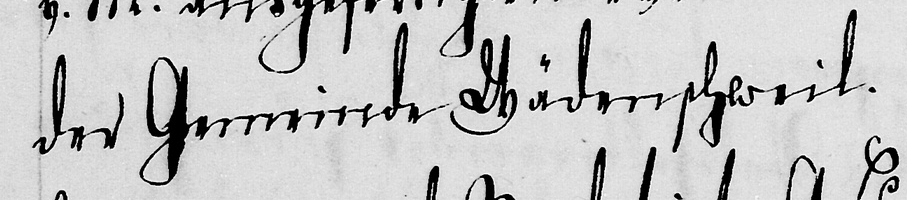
der Gemeinde Wädenschweil.
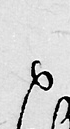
es
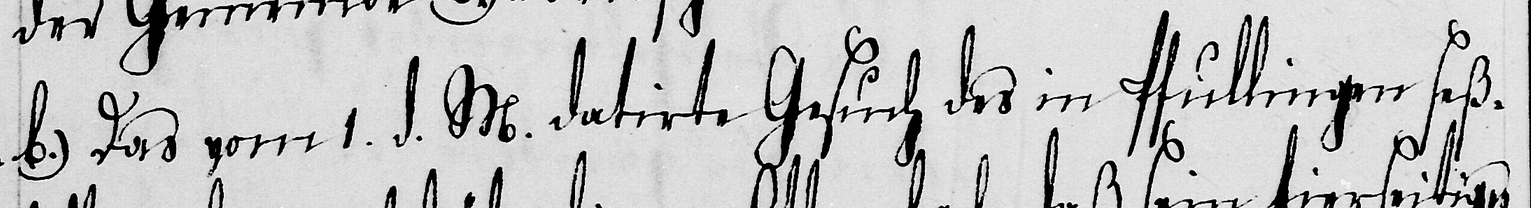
b.) Das vom 1. d. M. datirte Gesuch des in Pfullingen seß¬
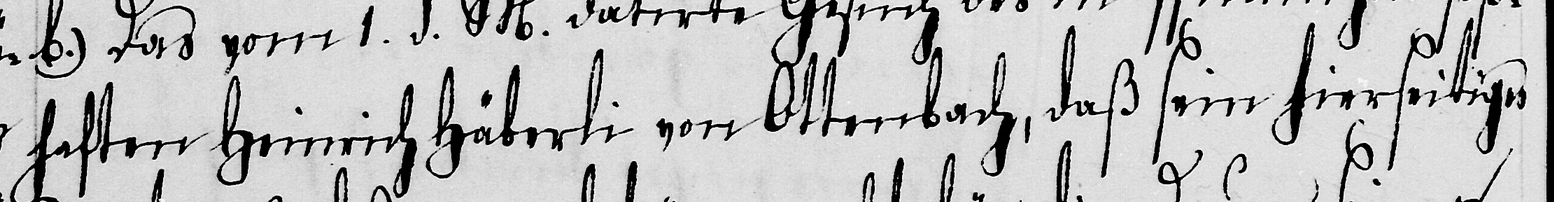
haften Heinrich Häberli von Ottenbach, daß sein hierseitig¬
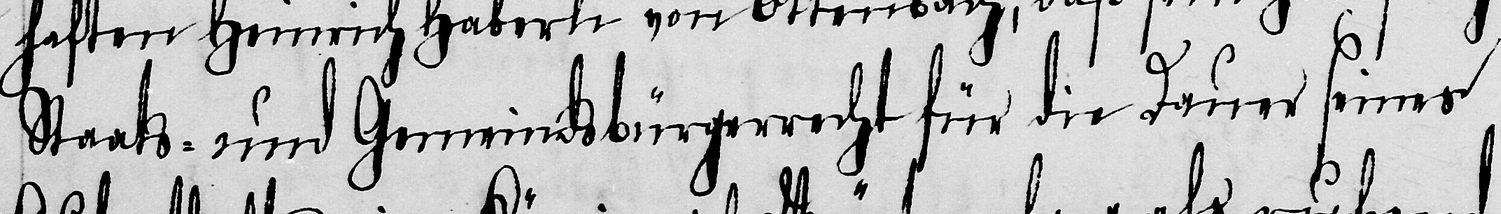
Staats- und Gemeindsbürgerrecht für die Dauer seines
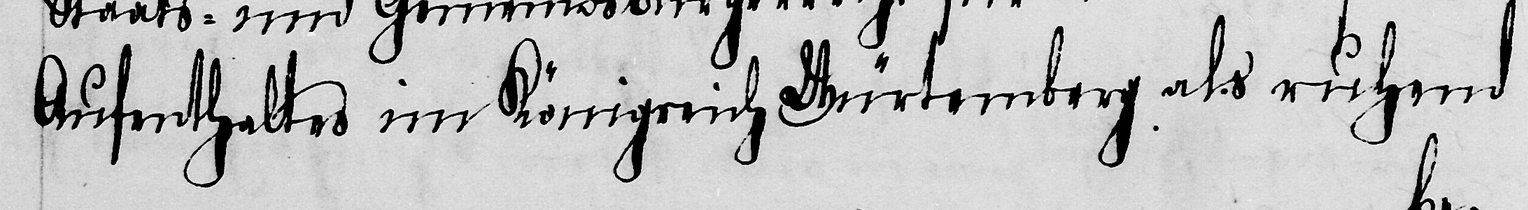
Aufenthaltes im Königreich Würtemberg als ruhend
